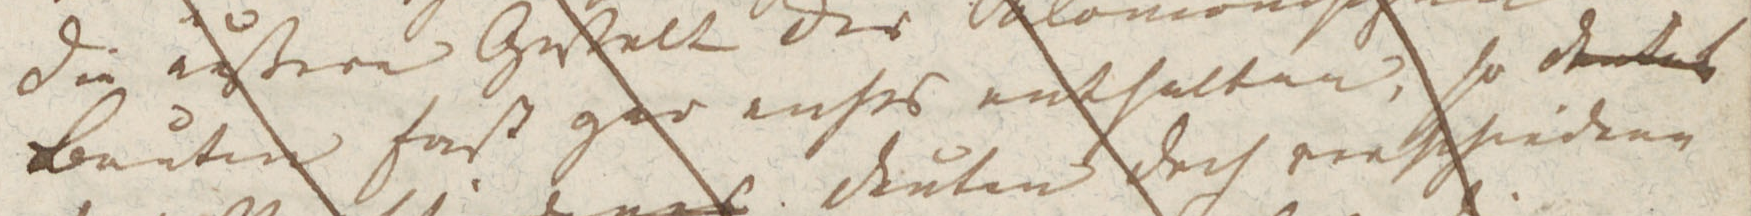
Bauten fast gar nichts enthalten, so deutet
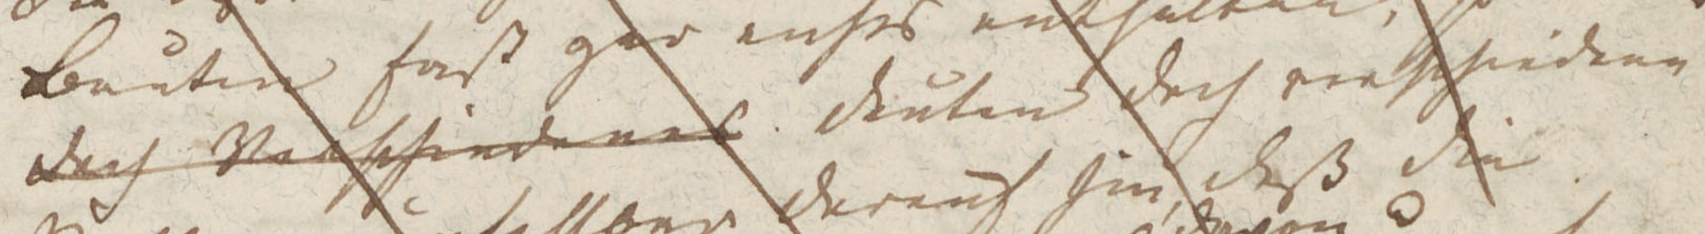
doch Verschiedenes deuten doch verschiedene
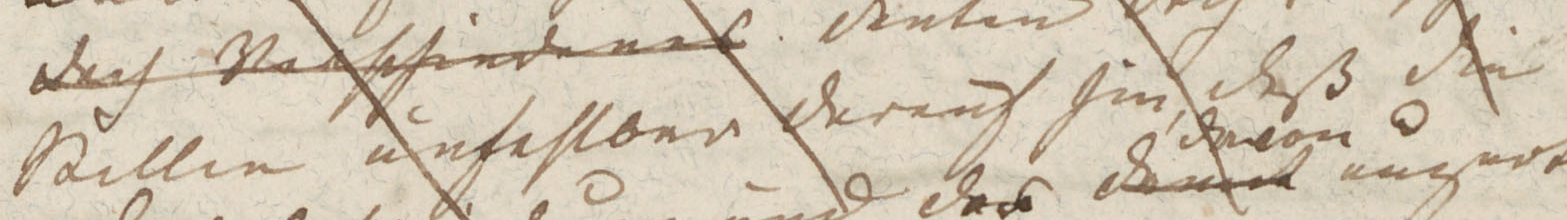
Stellen unfehlbar daraub hin, dass die
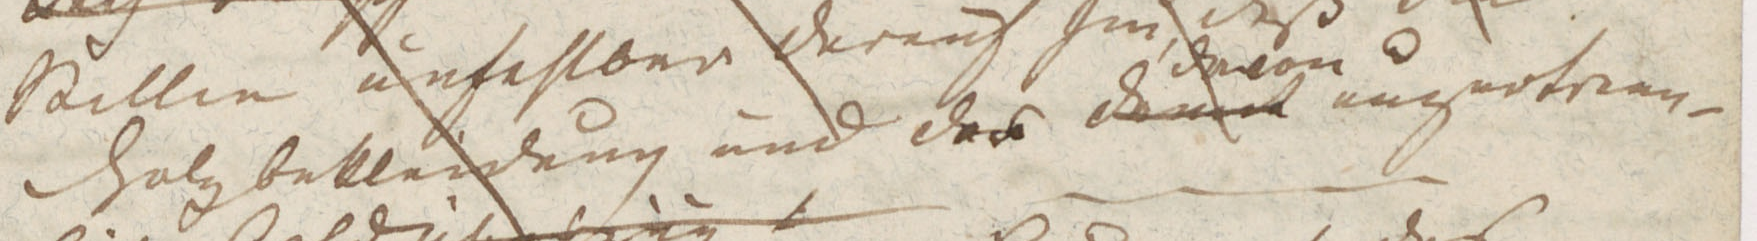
Holzbekleidung und daser damit davon unzertrenn-
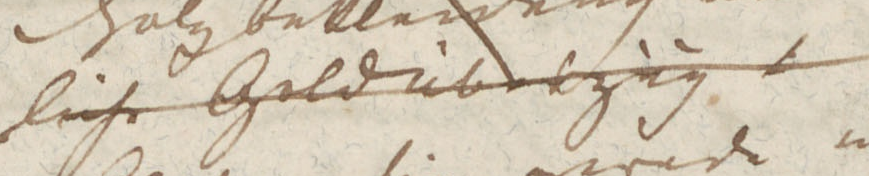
liche Goldüberzug
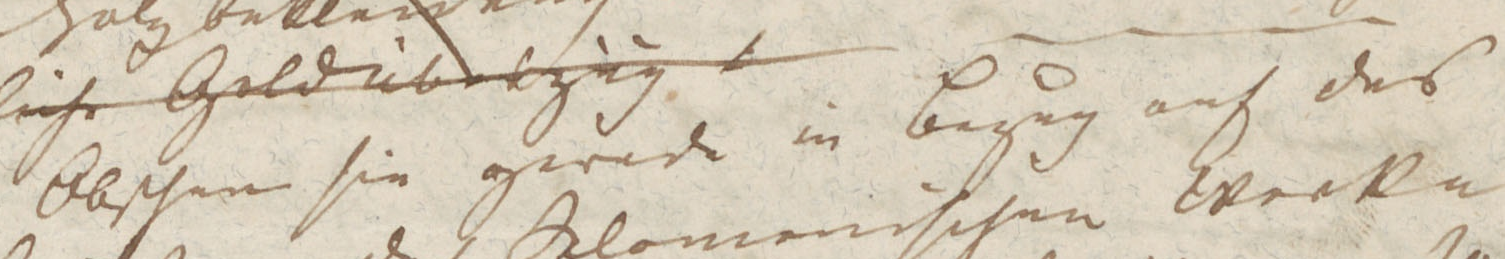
Obschon sie gerade in Bezug auf das
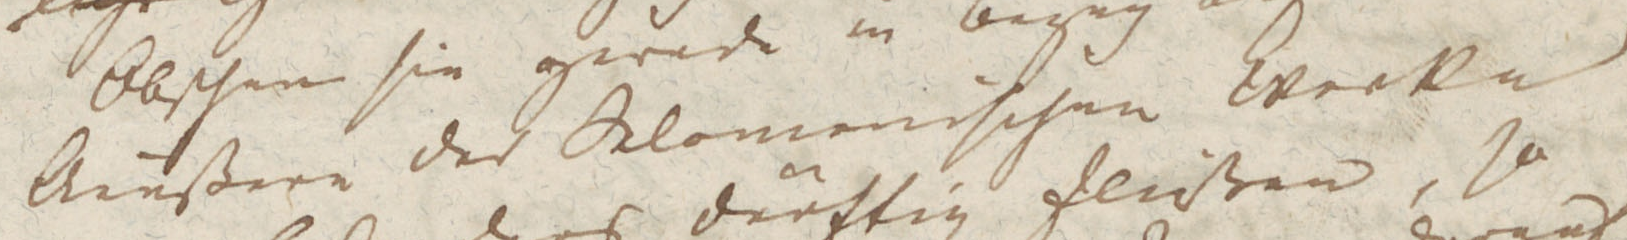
Aeussere der Salomonischen Werke
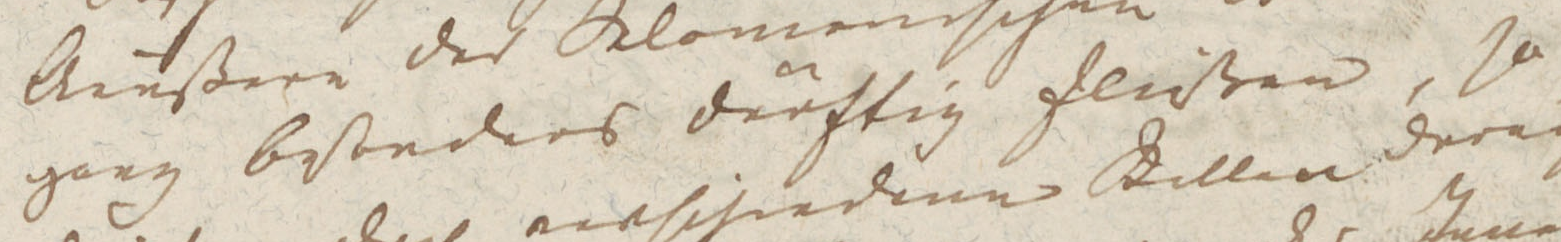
ganz besonders dürftig fliessen, so
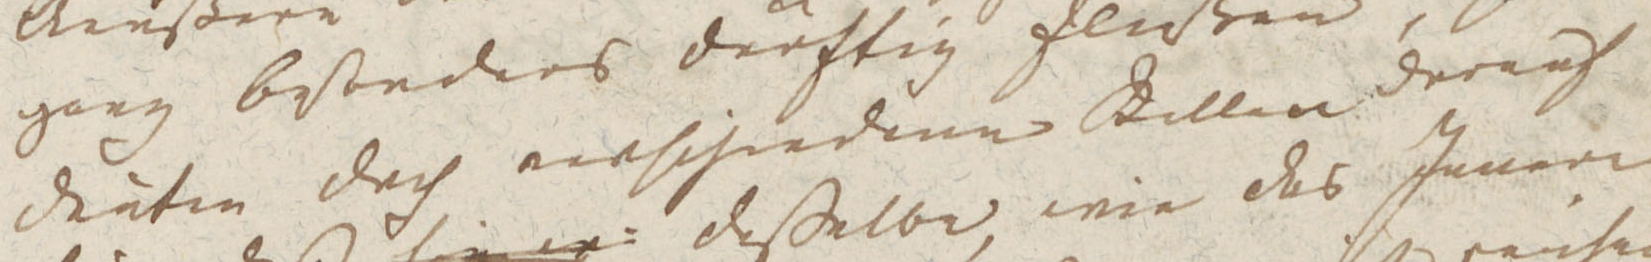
deuten doch verschiedene Stellen darauf
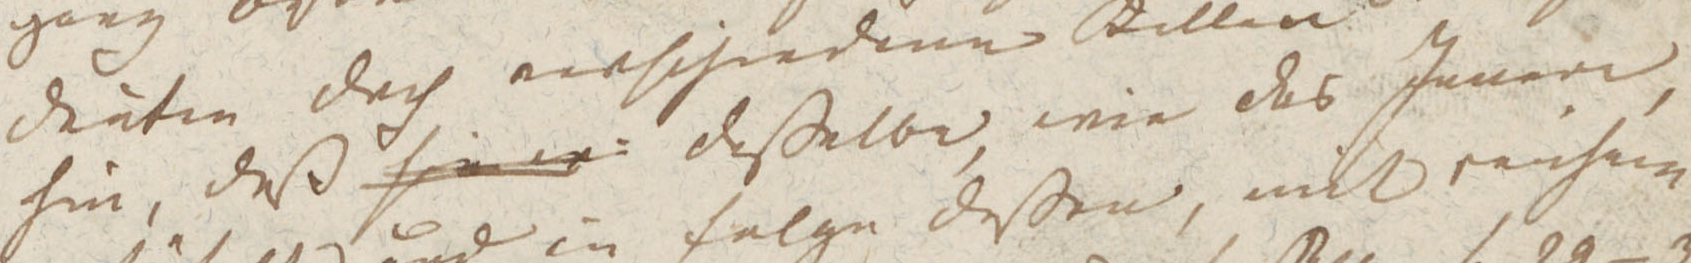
hin, dass sie w dasselbe, wie das Innere,
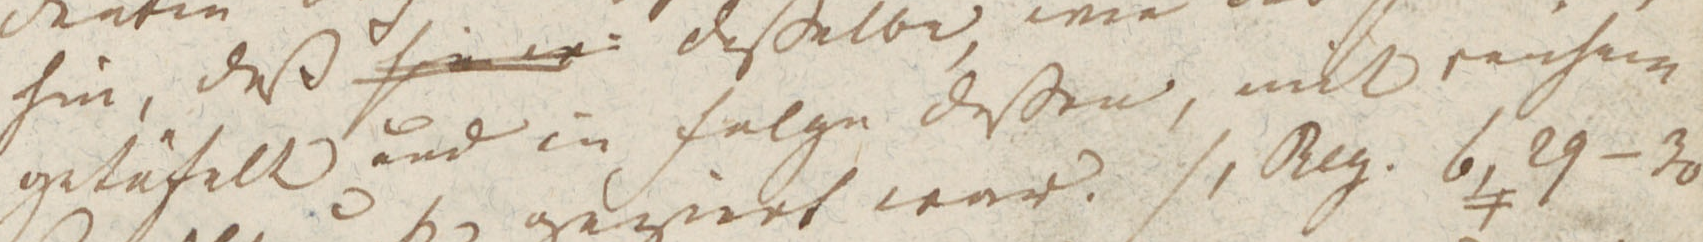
getäfelt und in Folge dessen, mit reichem
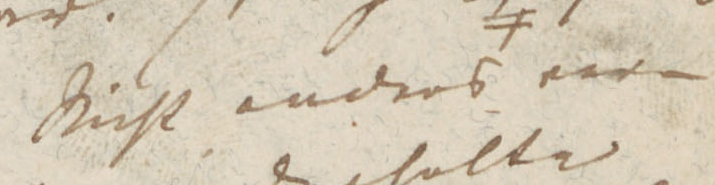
Nicht anders % ver-
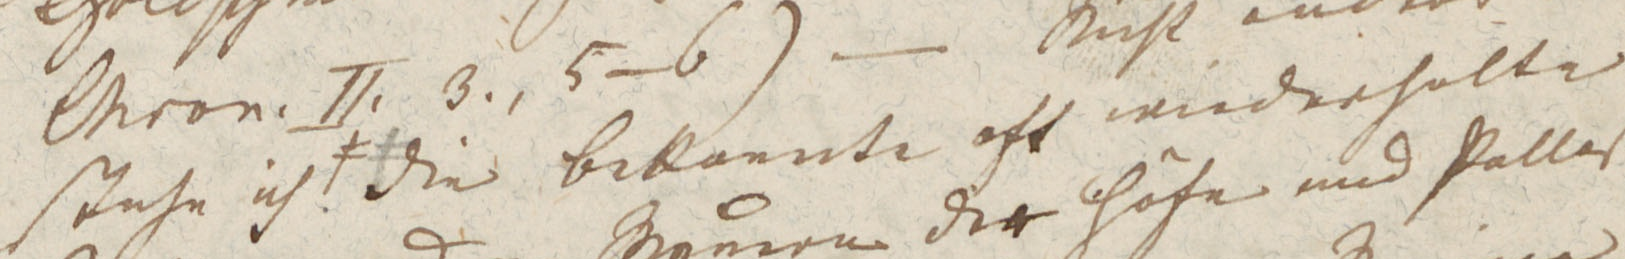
stehe ich % die bekannte oft wiederholte
